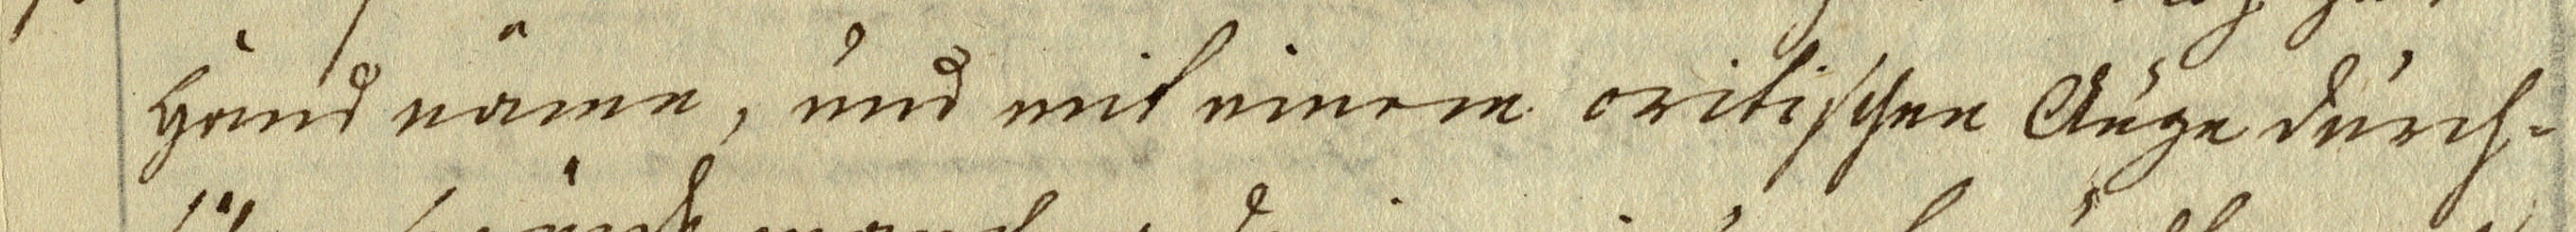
Hand näme, und mit einem critischen Auge durch¬
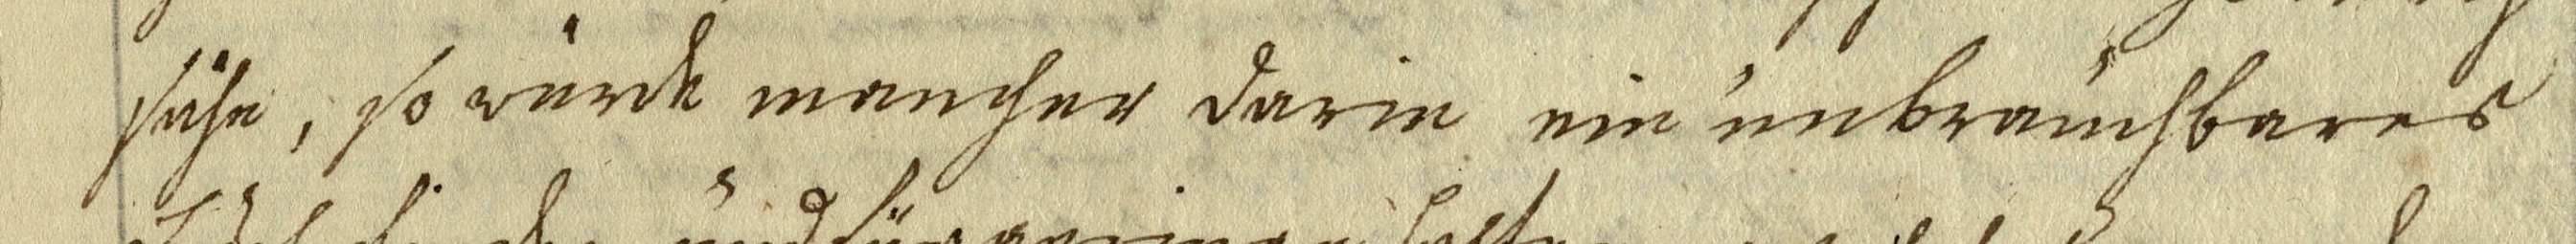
sähe, so würde mancher darin ein unbrauchbares
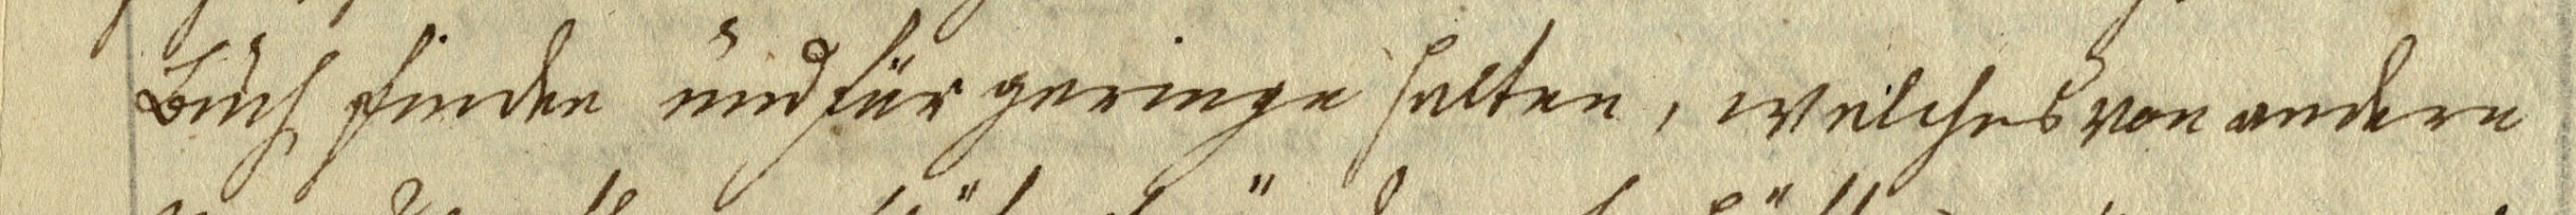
Buch finden und für geringe halten, welches von andern
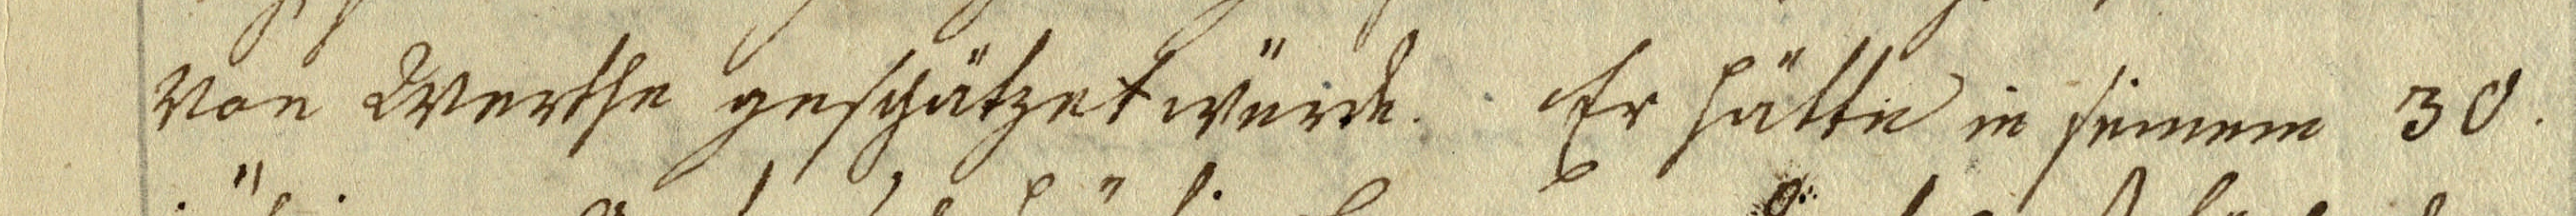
von Werthe geschätzet würde. Er hätte in seinem 30
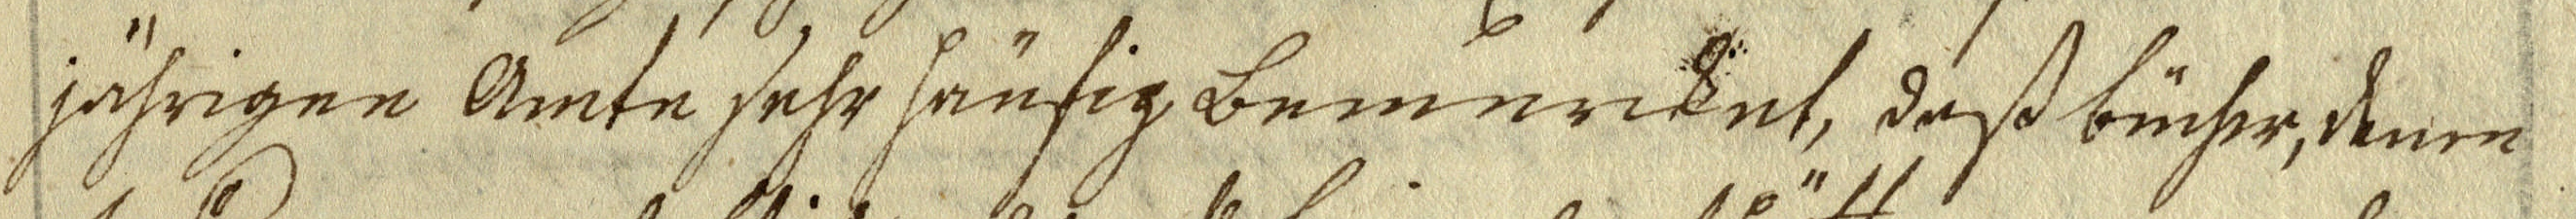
jährigen Amte sehr häufig bemercket, daß bücher, denen
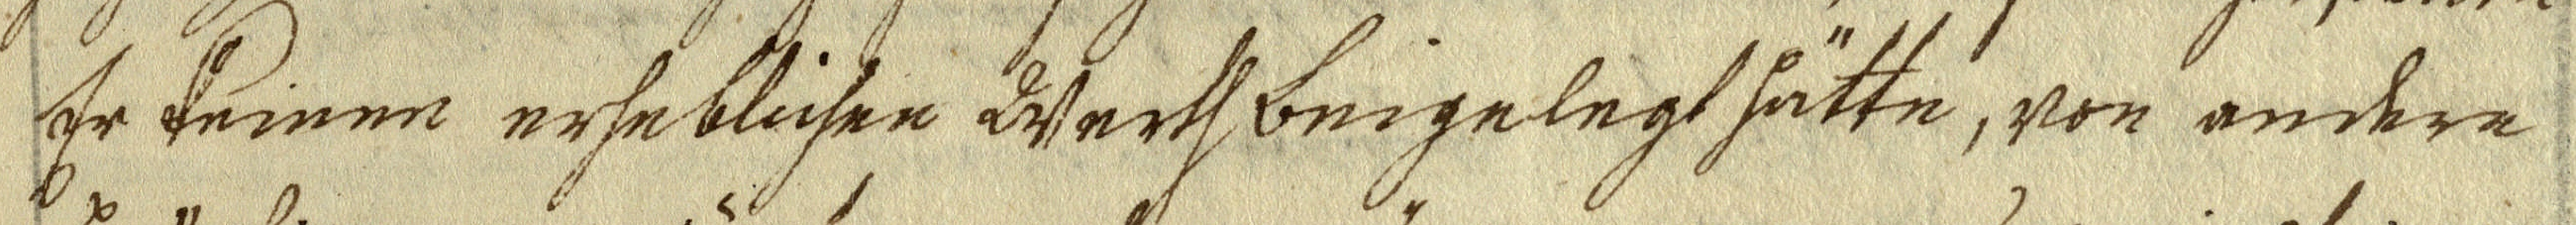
Er keinen erheblichen Werth beigelegt hätte, von andern
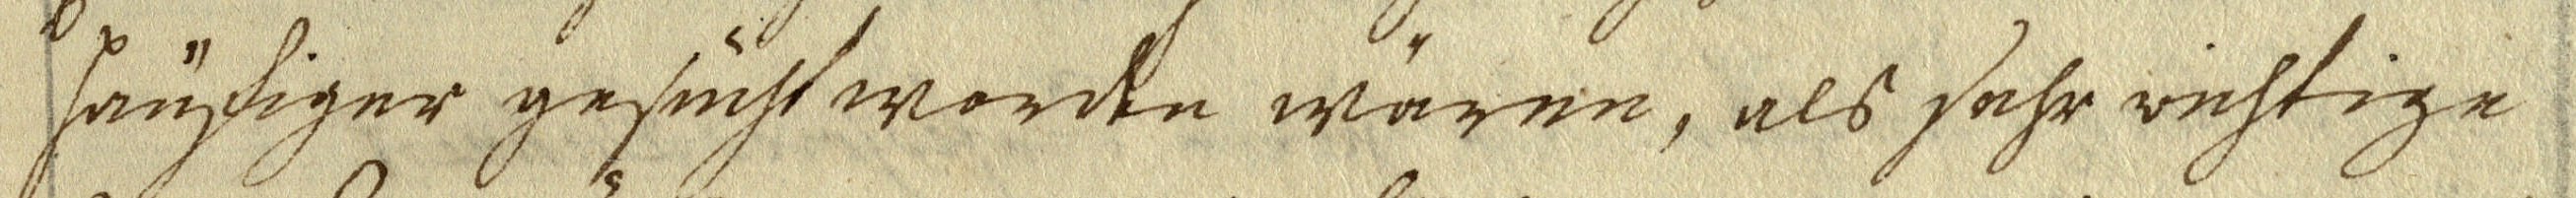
häufiger gesucht worden wären, als sehr wichtige
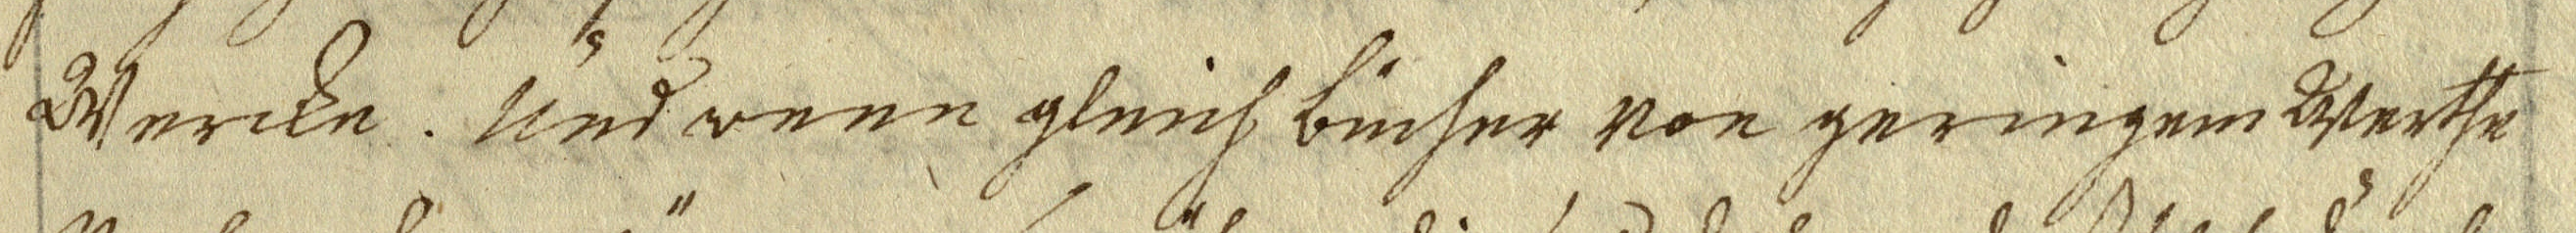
Wercke. Und wenn gleich Bücher von geringem Werthe
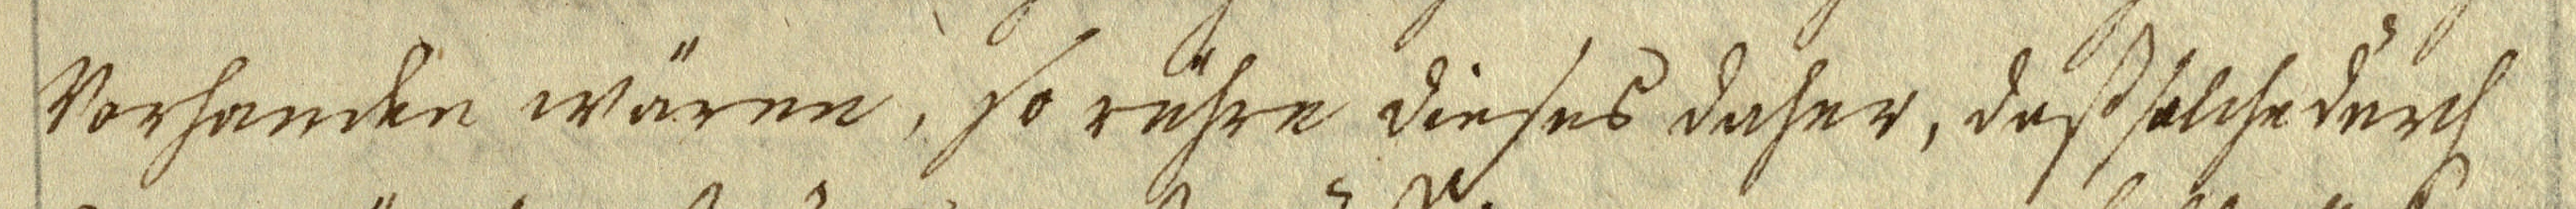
vorhanden wären, so rühre dieses daher, daß solche durch
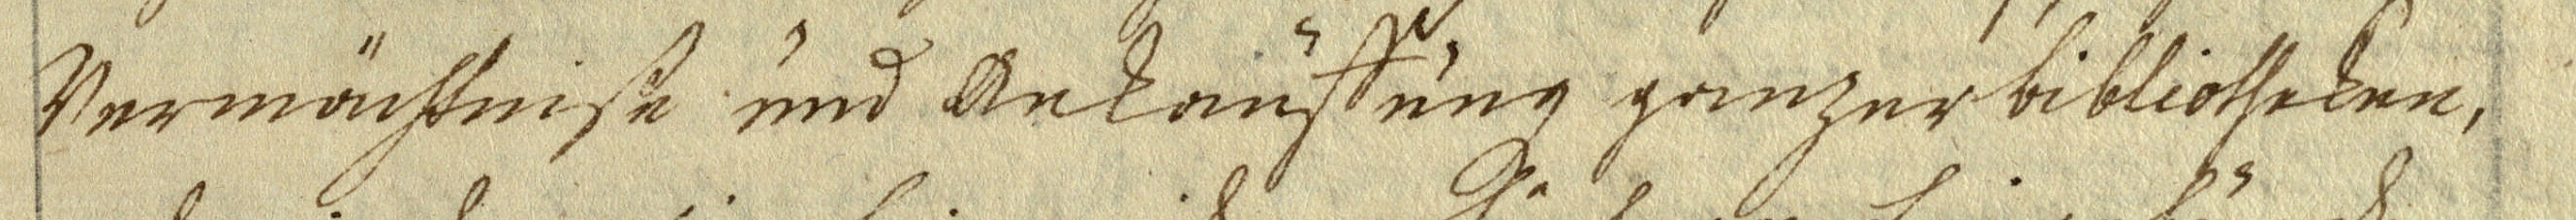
Vermächtniße und Ankauffung ganzer Bibliotheken,
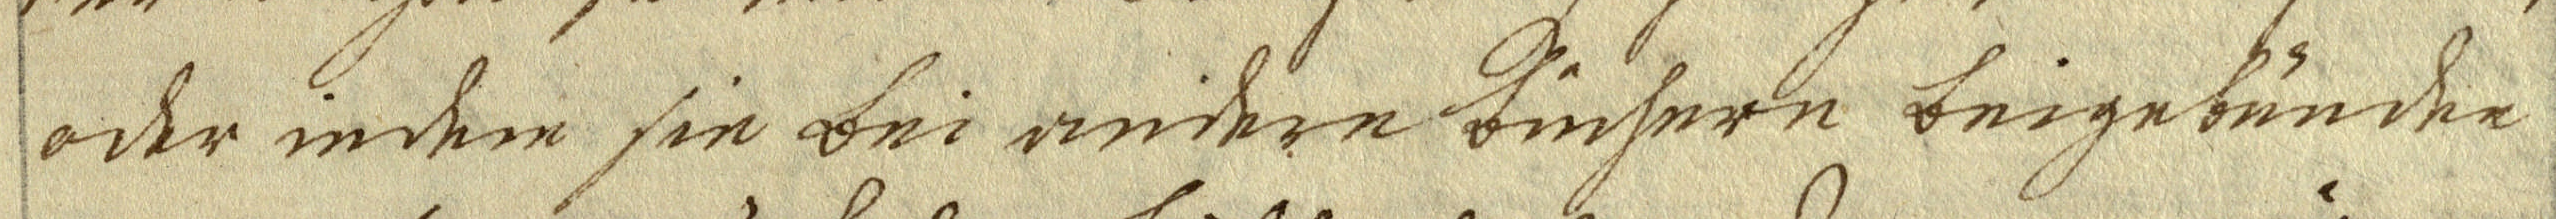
oder indem sie bei andern Büchern beigebunden
